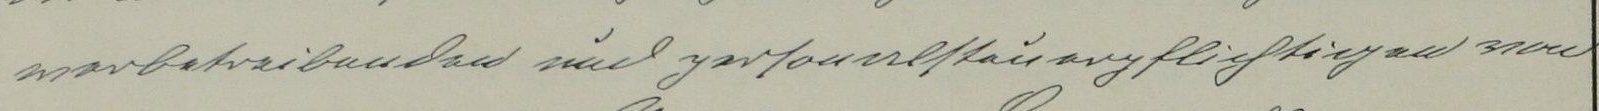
werbetreibenden und personalsteuerpflichtigen von
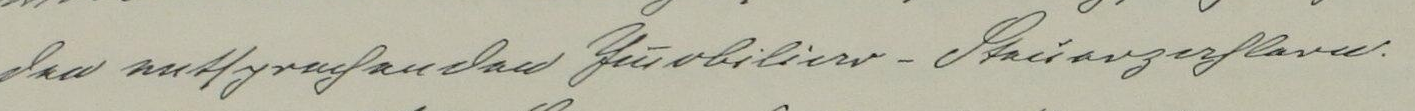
den entsprechenden Immobiliar-Steuerzahlern.
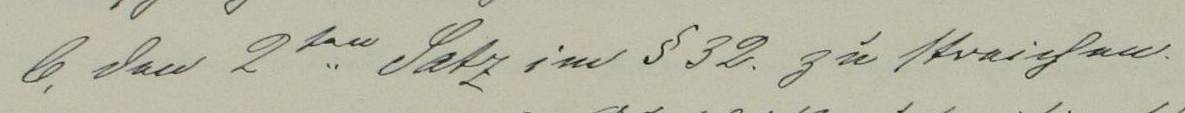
b. den 2ten Satz im § 32. zu streichen.
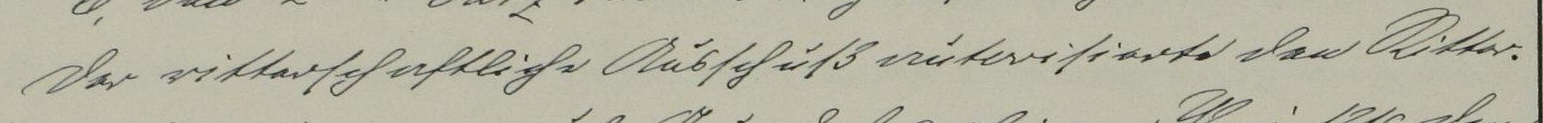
Der ritterschaftliche Ausschuß autorisierte den Ritter-
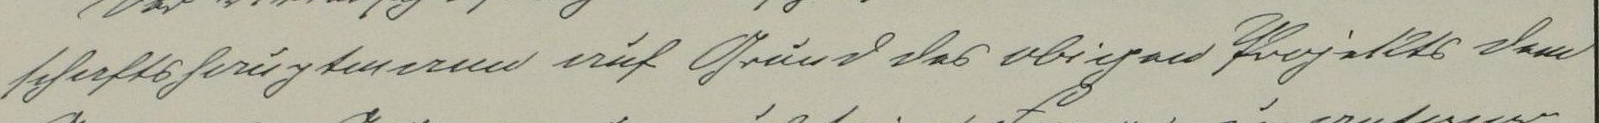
schaftshauptmann auf Grund des obigen Projekts dem
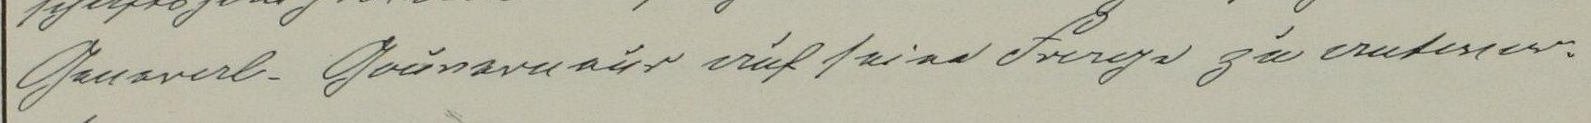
General-Gouverneur auf seine Frage zu antwor-
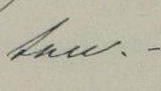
ten.
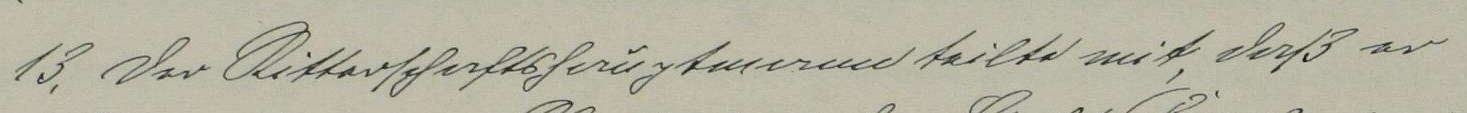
13. Der Ritterschaftshauptmann teilte mit, daß er
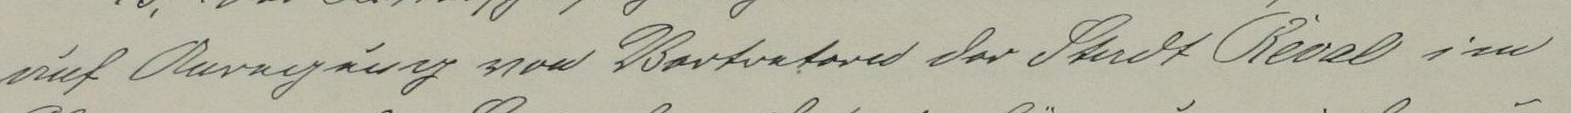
auf Anregung von Vertretern der Stadt Reval im
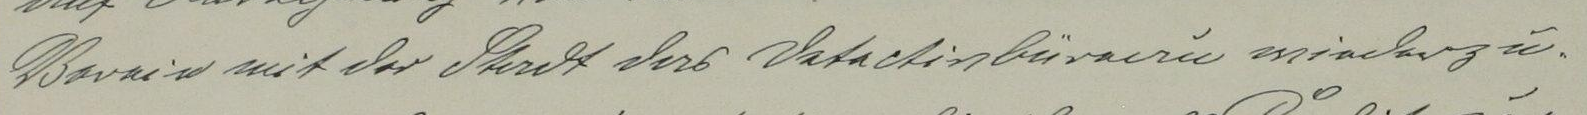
Verein mit der Stadt das Detectivbüreau wiederzu-
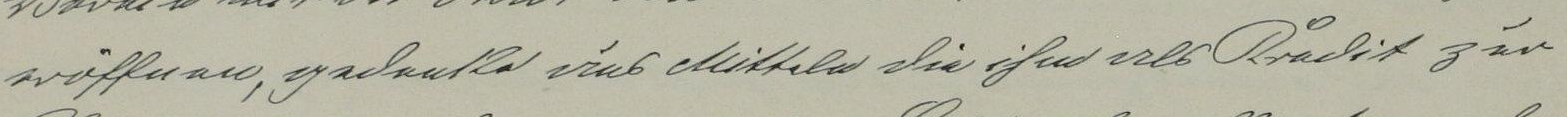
eröffnen, gedenke aus Mitteln die ihm als Kredit zur
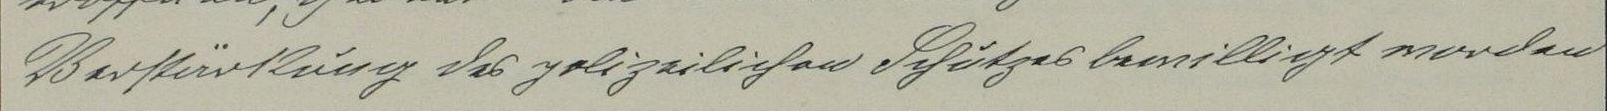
Verstärkung des polizeilichen Schutzes bewilligt worden
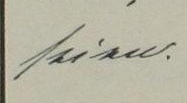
seien.
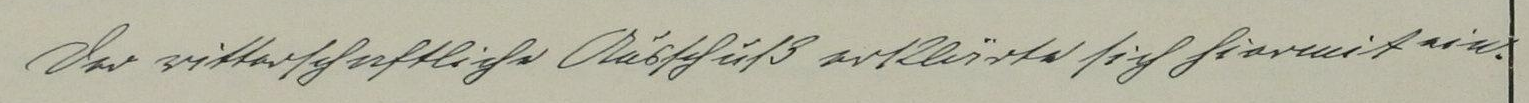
Der ritterschaftliche Ausschuß erklärte sich hiermit ein-
